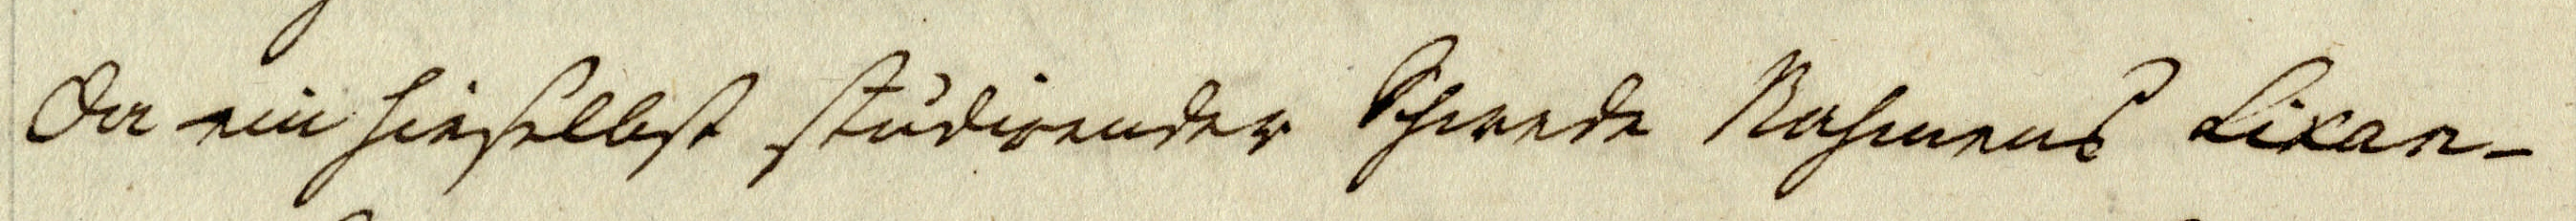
5. Da ein hieselbst studirender Schwede Nahmens Likan¬
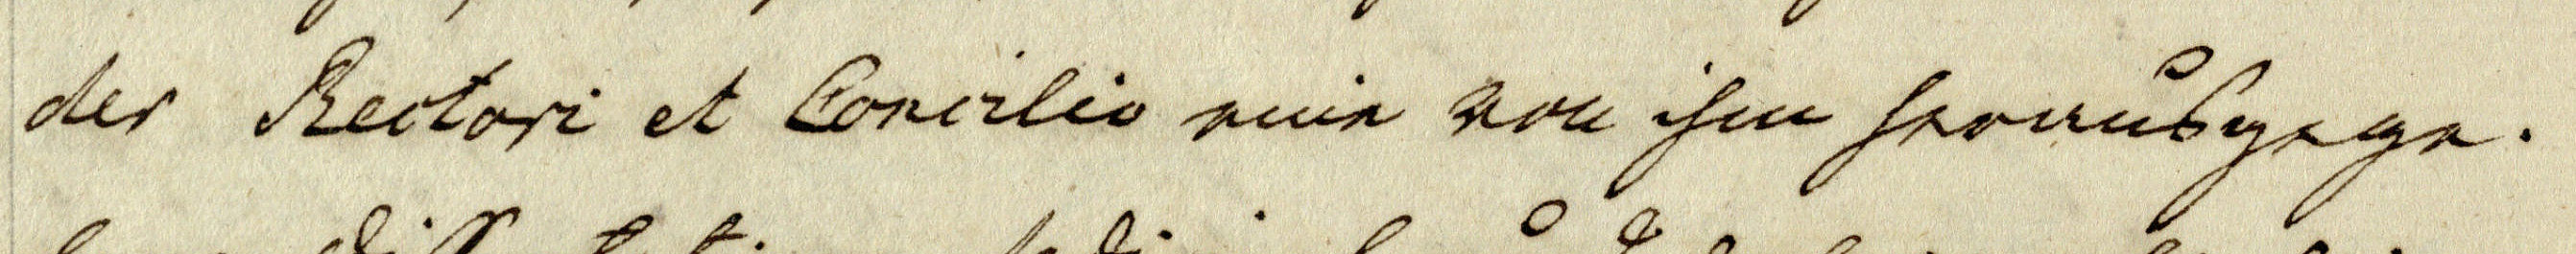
der Rectori et Concilio eine von ihm herausgege¬
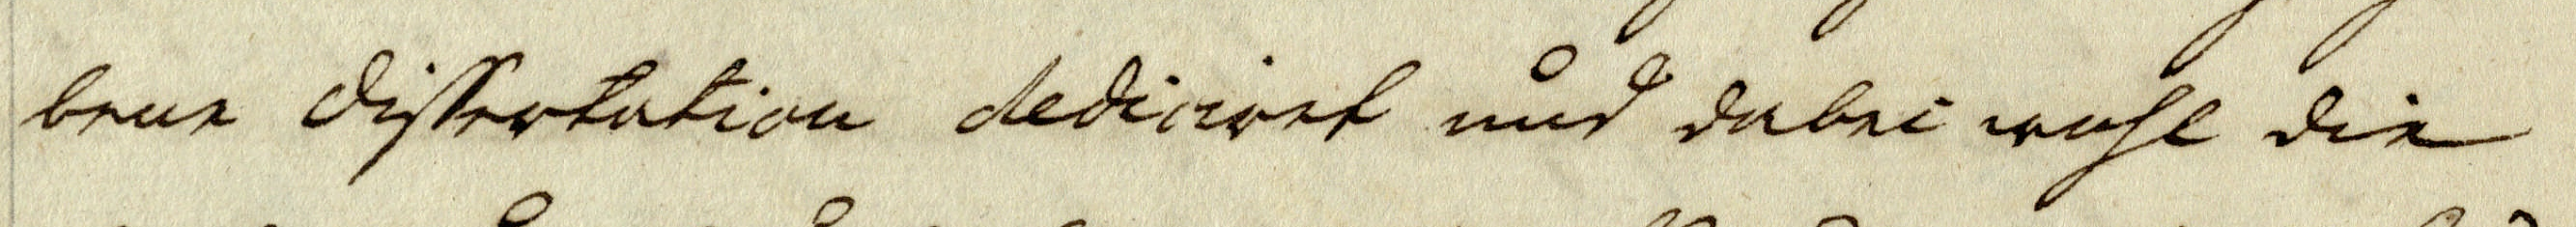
bene dissertation dediciret und dabei wohl die
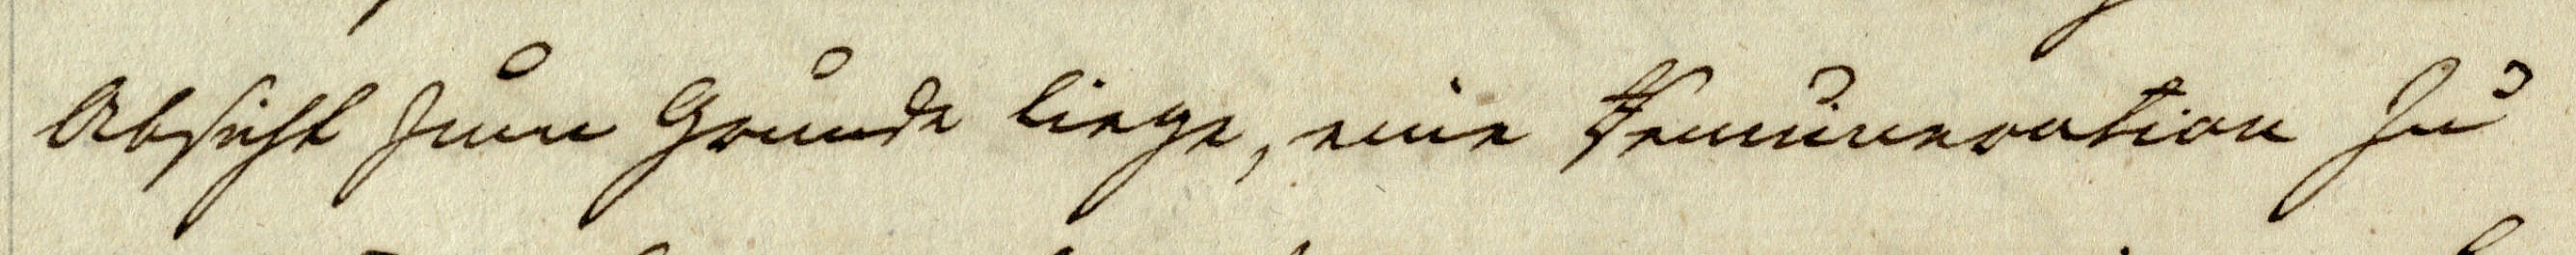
Absicht zum Grunde liege, eine Remuneration zu
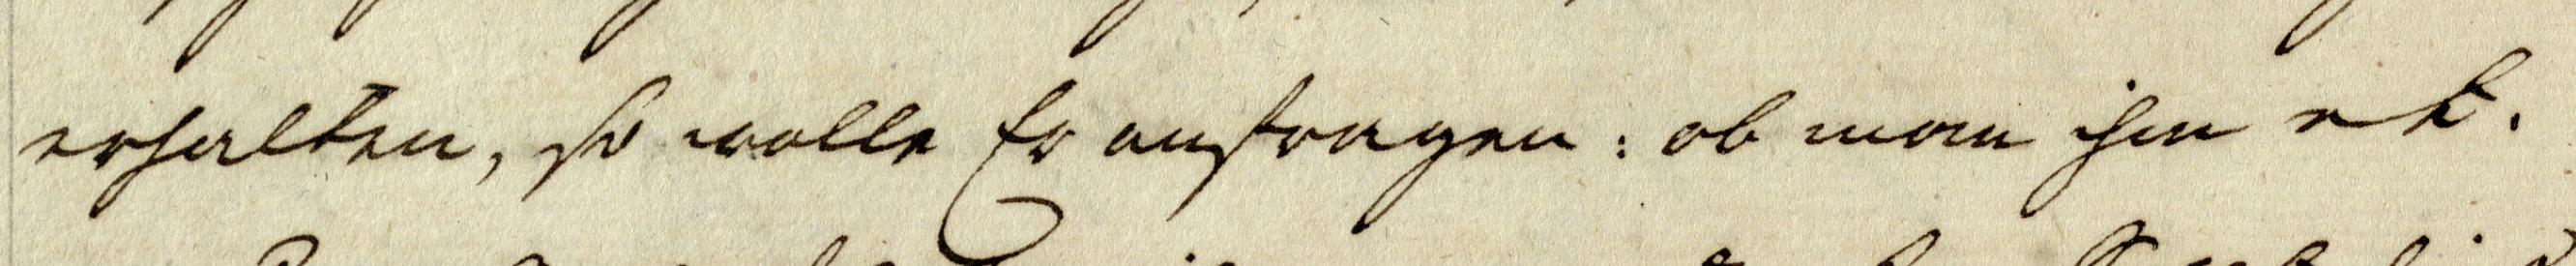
erhalten, so wolle Er anfragen: ob man ihm et¬
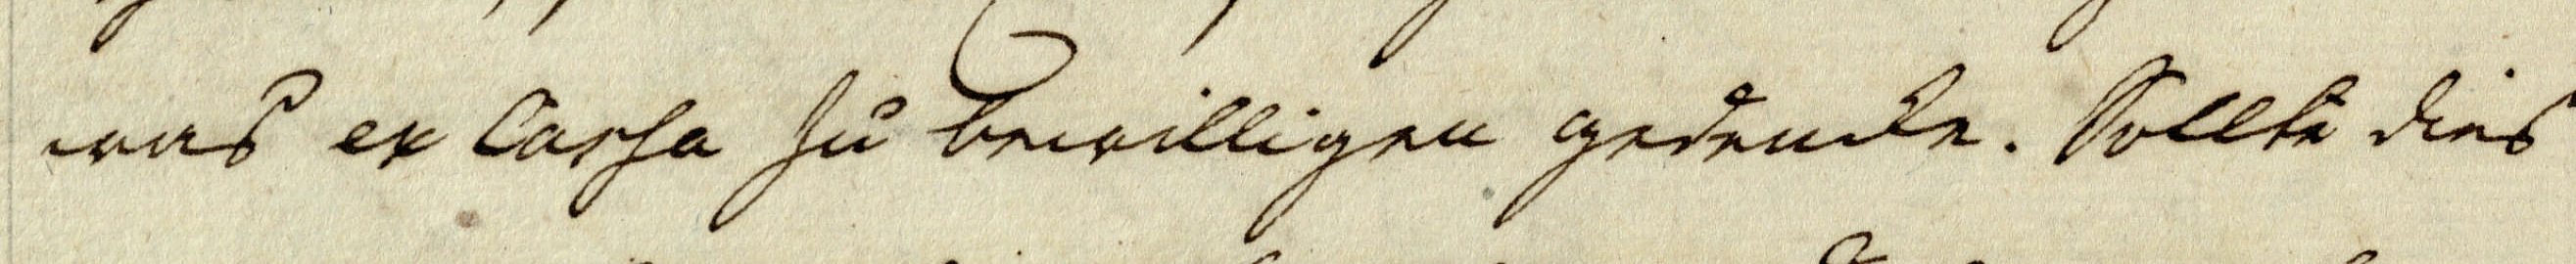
was ex Cassa zu bewilligen gedencke. Sollte dies
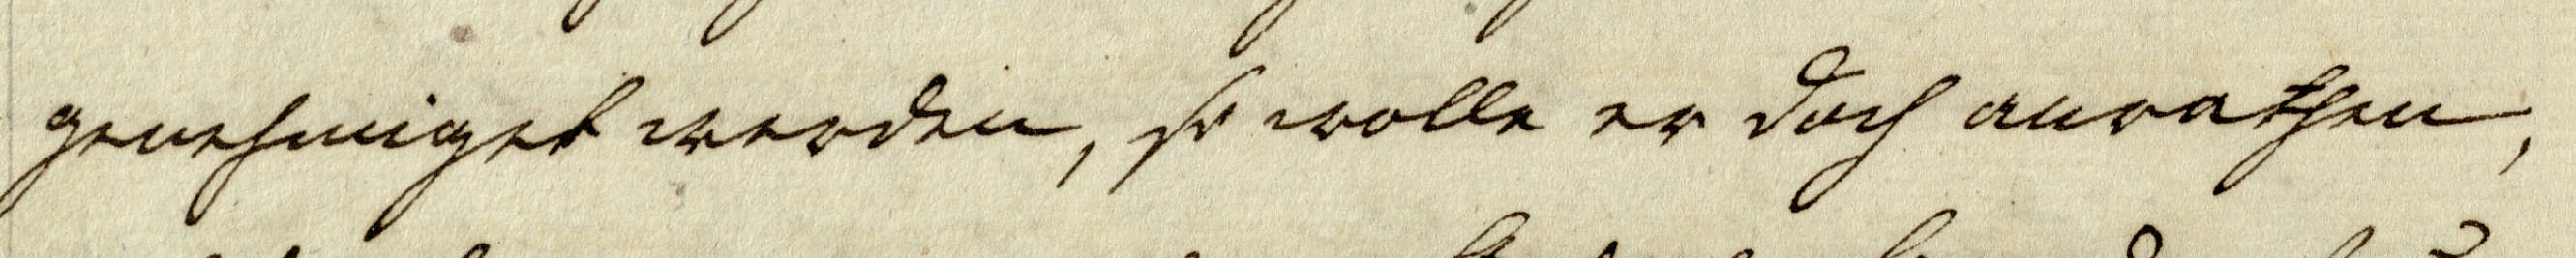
genehmiget werden, so wolle er doch anrathen,
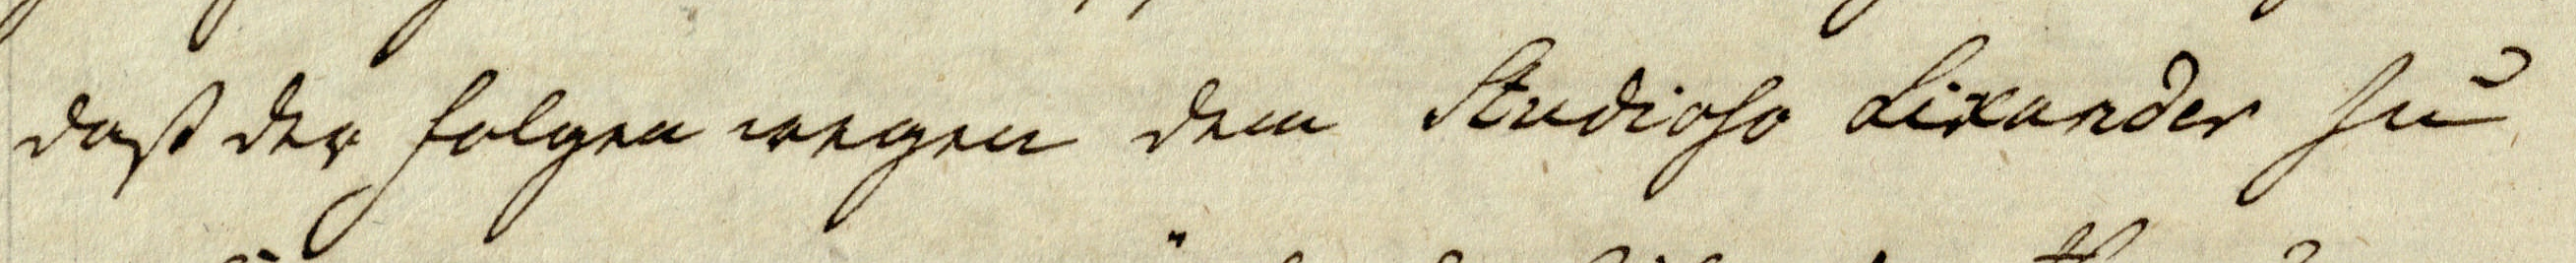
daß der Folgen wegen dem Studioso Likander zu
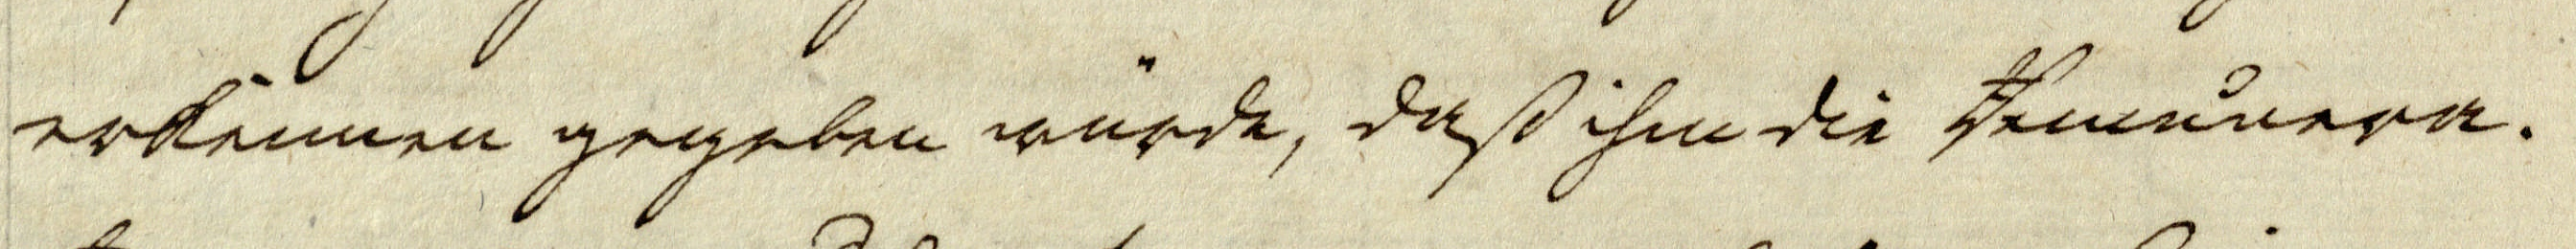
erkennen gegeben würde, daß ihm die Remunera¬
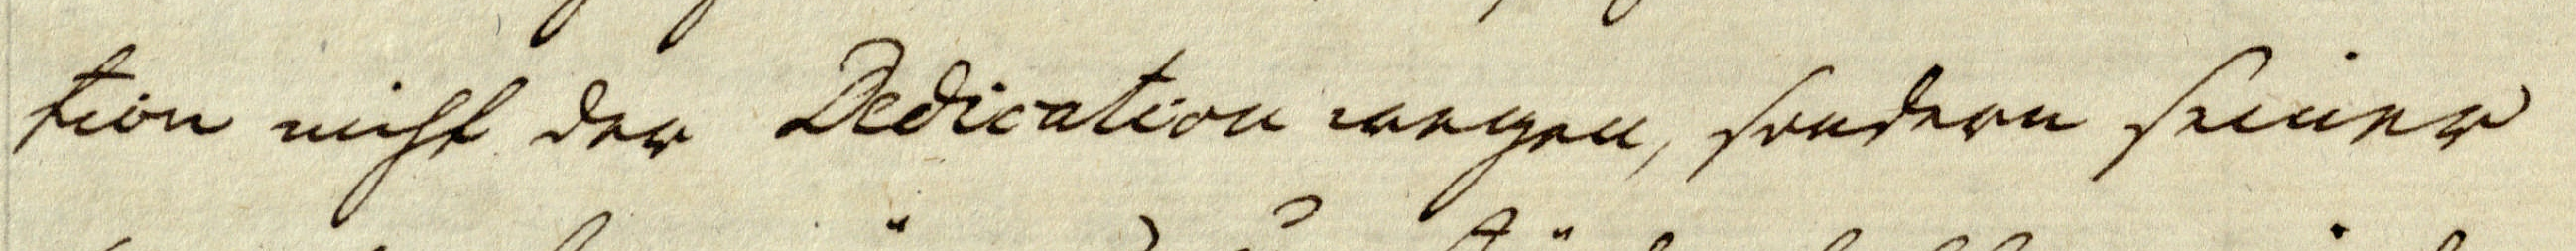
tion nicht der Dedication wegen, sondern seiner
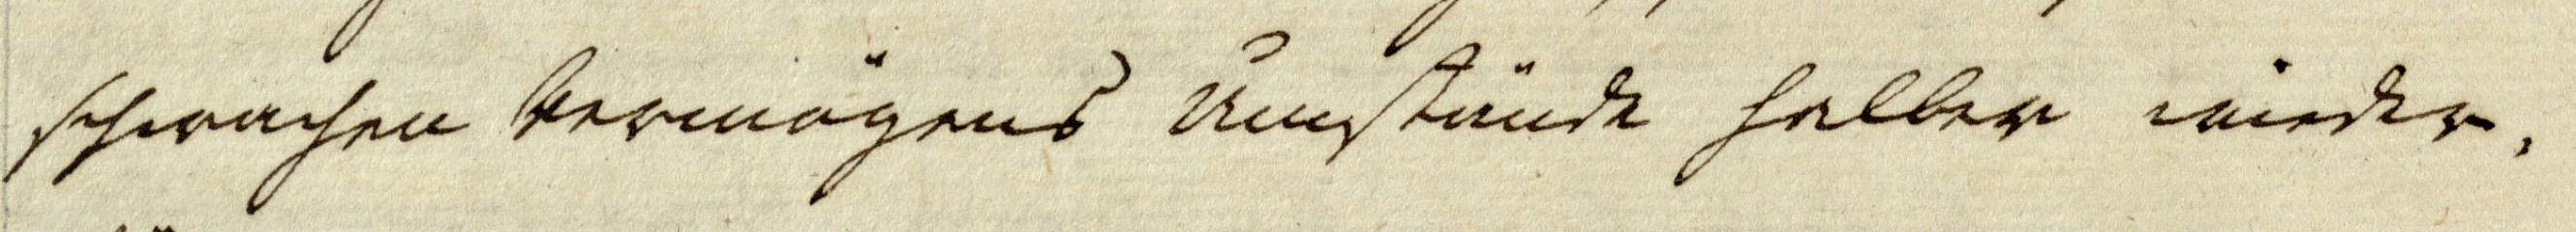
schwachen Vermögens Umstände halben wieder¬
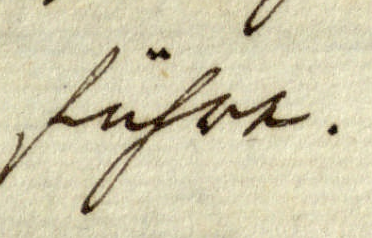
führe.
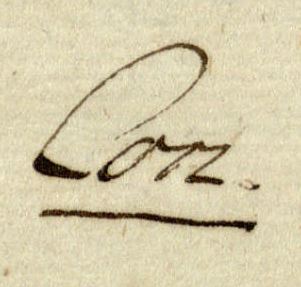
Con.
